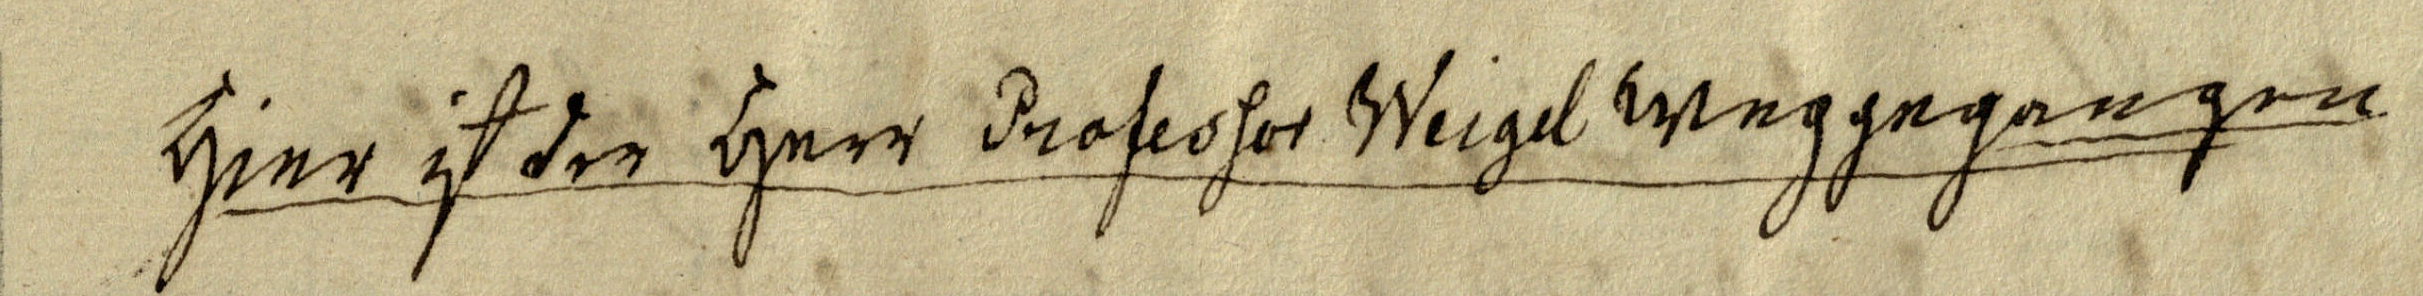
Hier ist der Herr Professor Weigel weggegangen
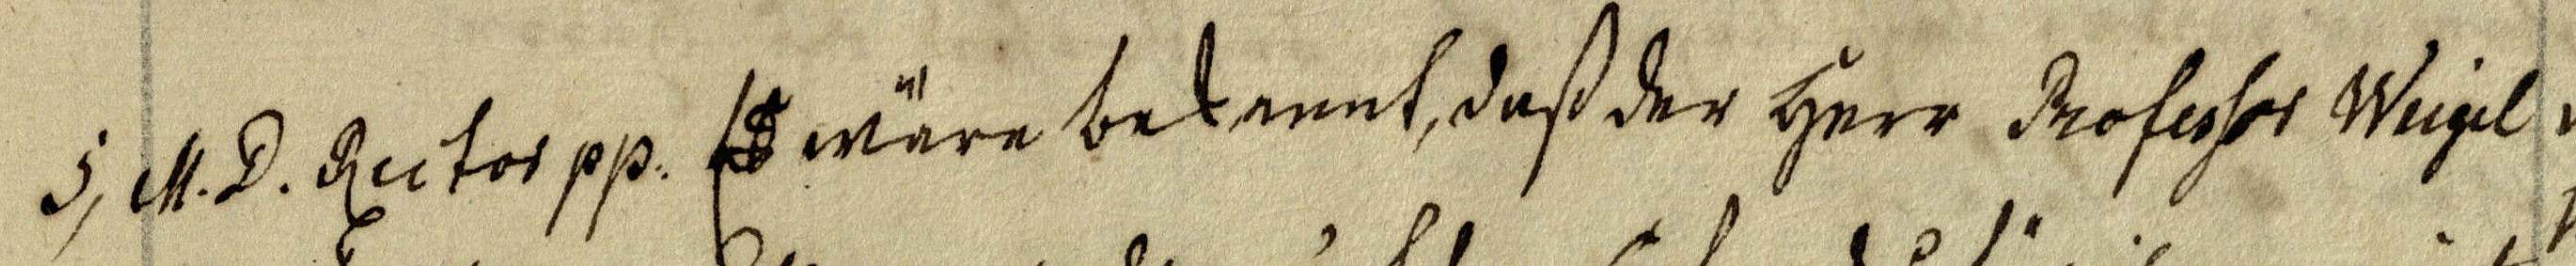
5, M. D. Rector pp: Es wäre bekannt, daß der Herr Professor Weigel
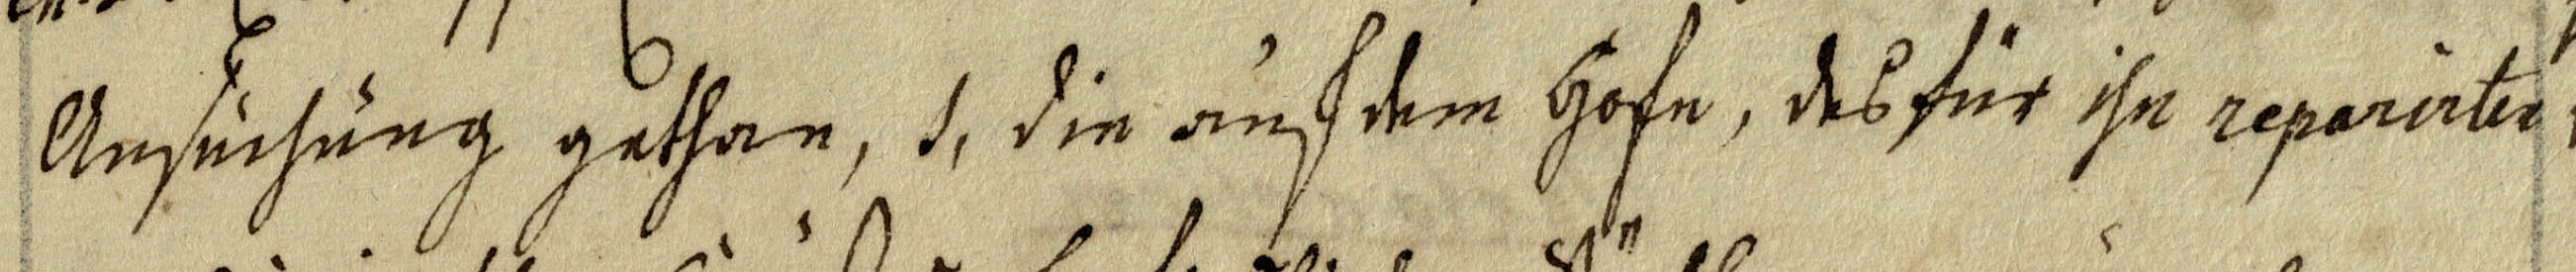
Ansuchung gethan, 1, die auf dem Hofe, des für ihn reparirten
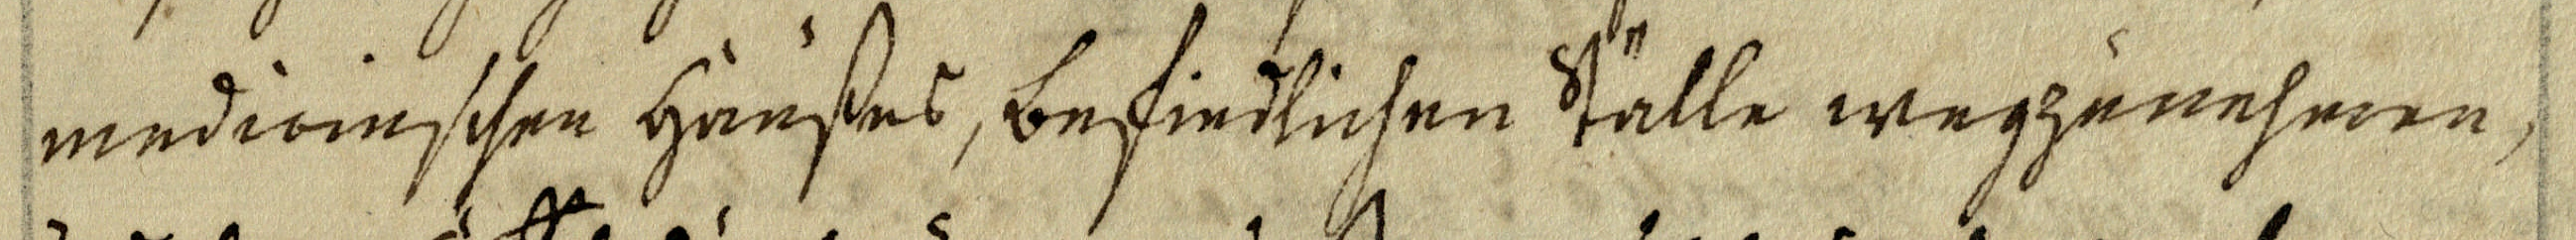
medicinischen Haußes, befindlichen Ställe wegzunehmen
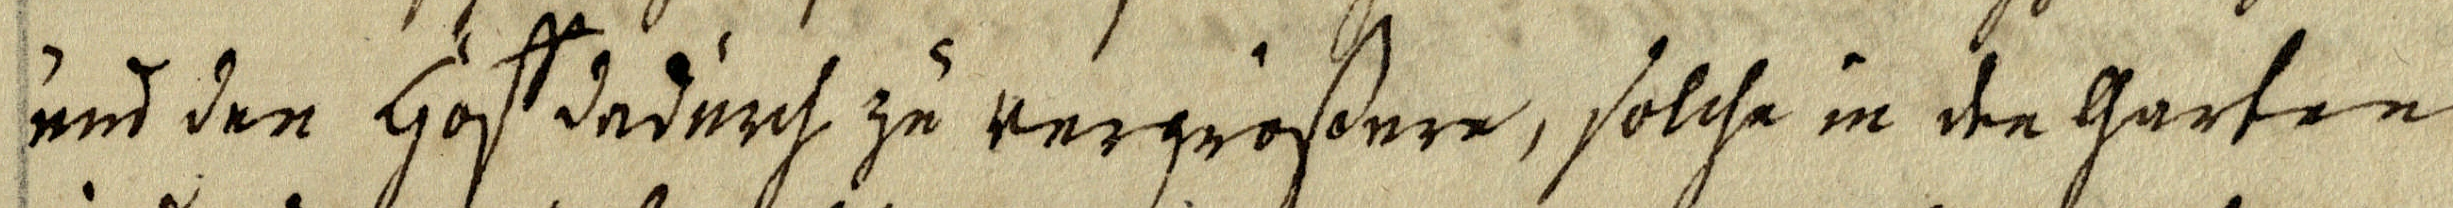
und den Hof dadurch zu vergrößern, solche in den Garten
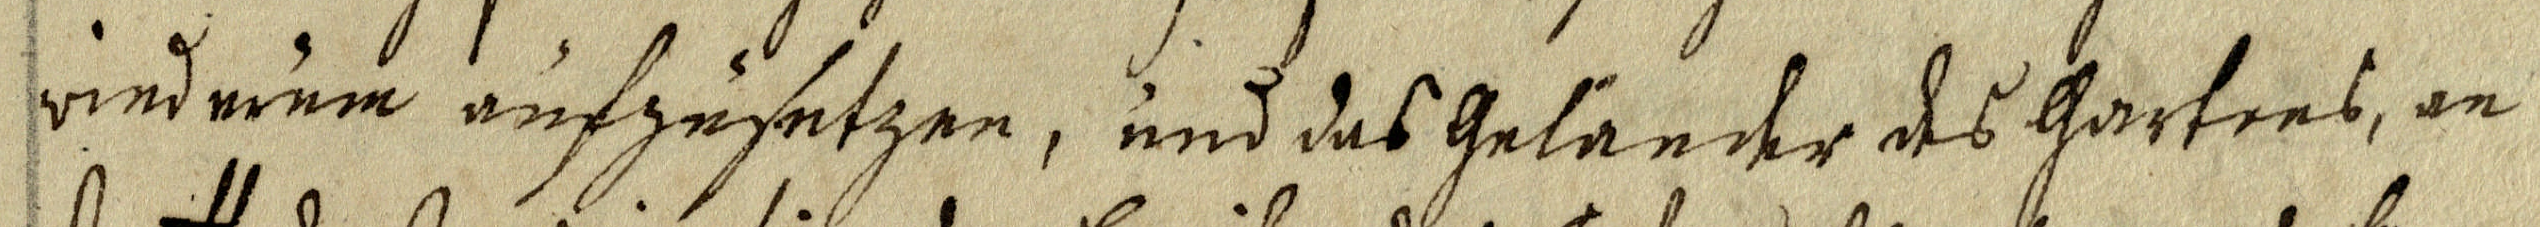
wiederum aufzusetzen, und das Geländer des Gartens, an
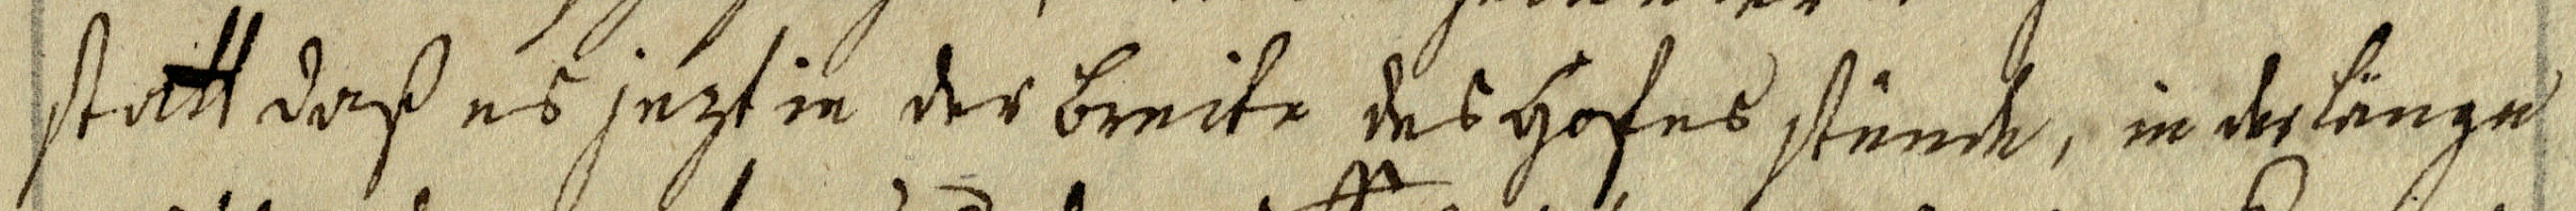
statt daß es jezt in der Breite des Hofes stünde, in der Länge
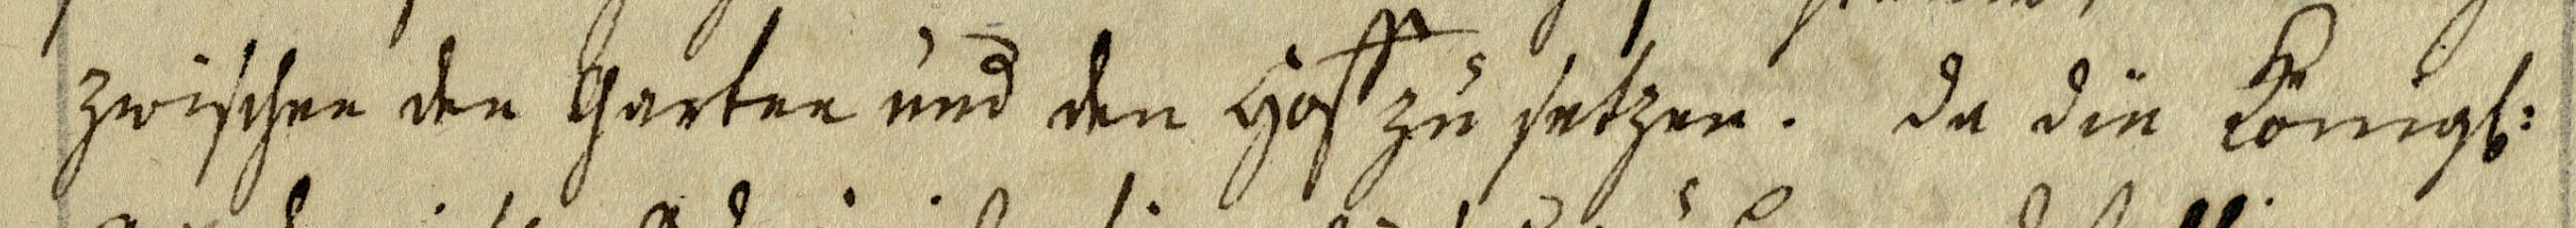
zwischen den Garten und den Hof zu setzen. da die Königl:
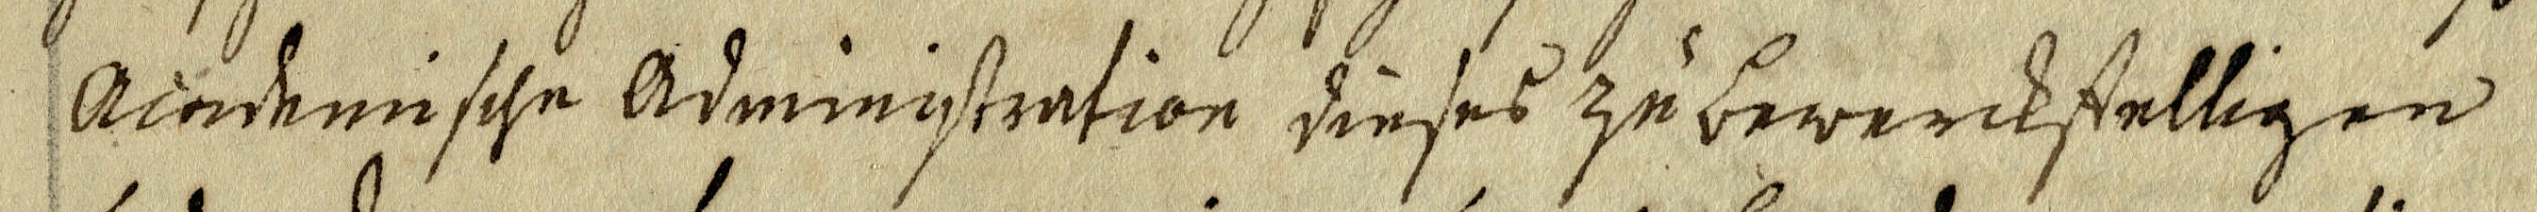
Academische Administration dieses zu bewerckstelligen
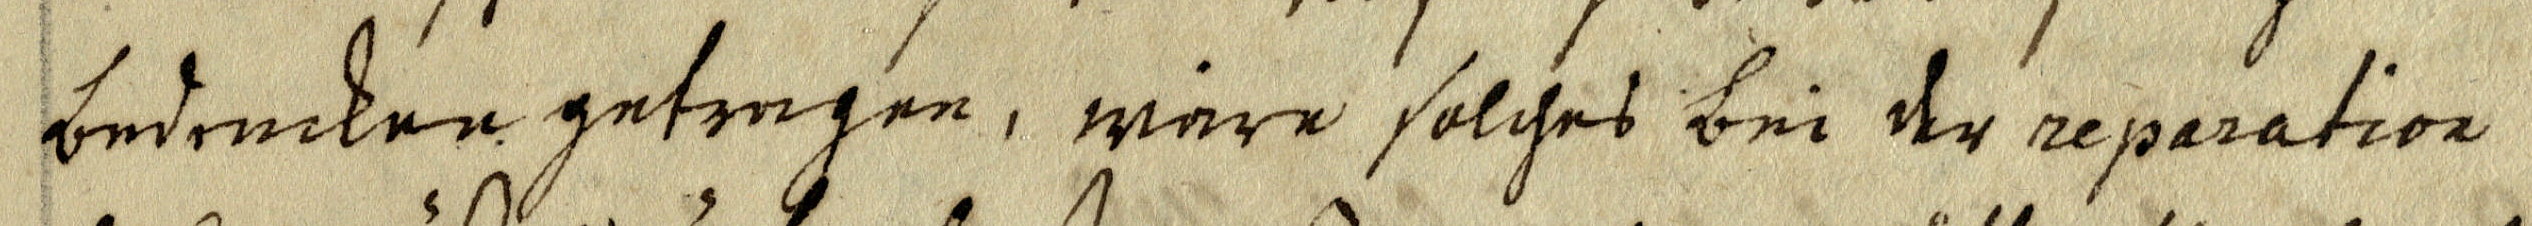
Bedencken getragen, wäre solches bei der reparation
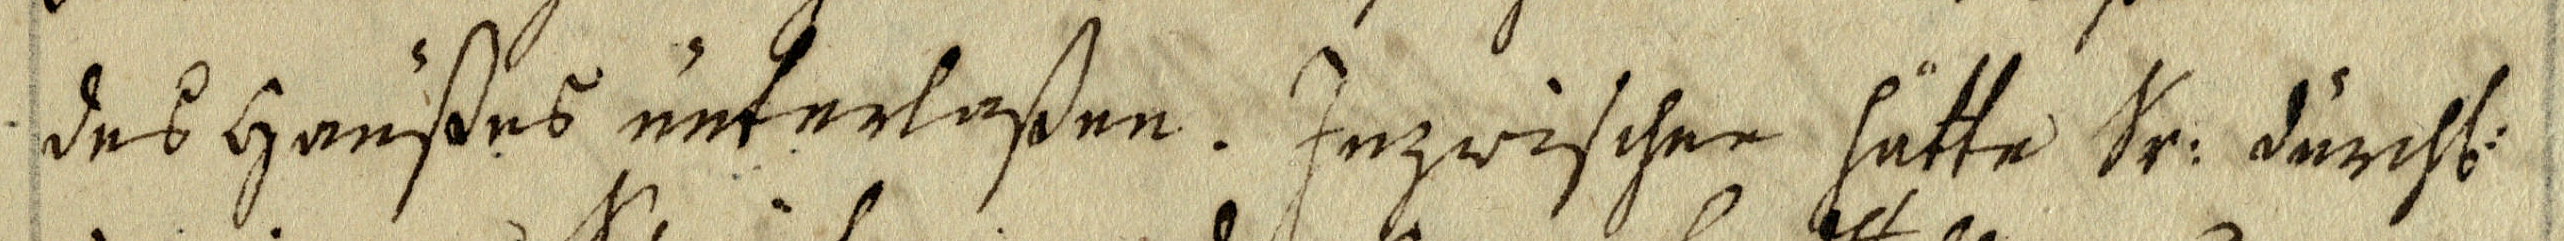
des Haußes unterlaßen. Inzwischen hätte Sr: Durchl:
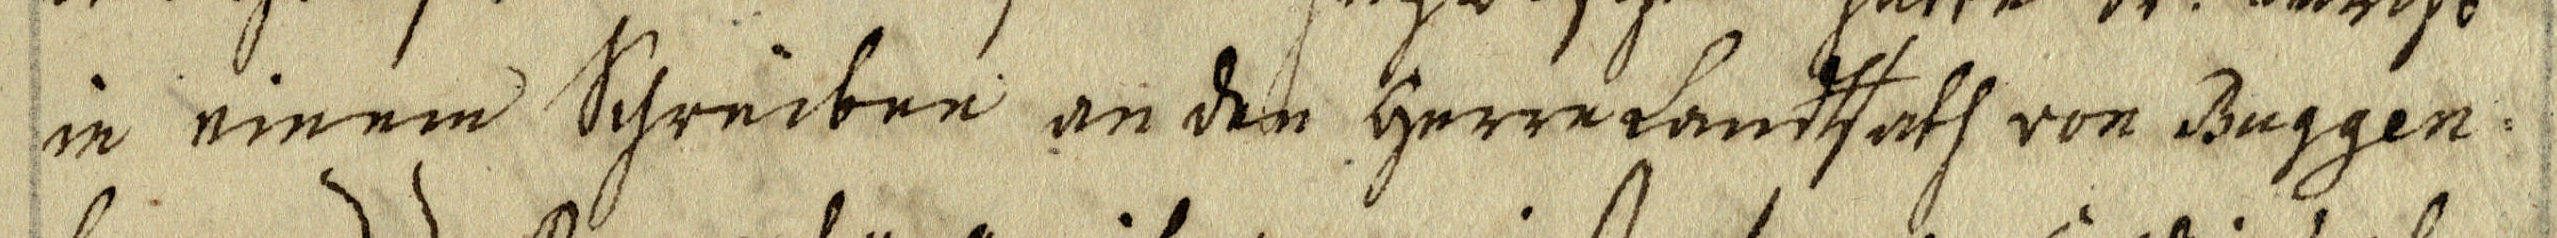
in einem Schreiben an den Herrn LandRath von Buggen¬
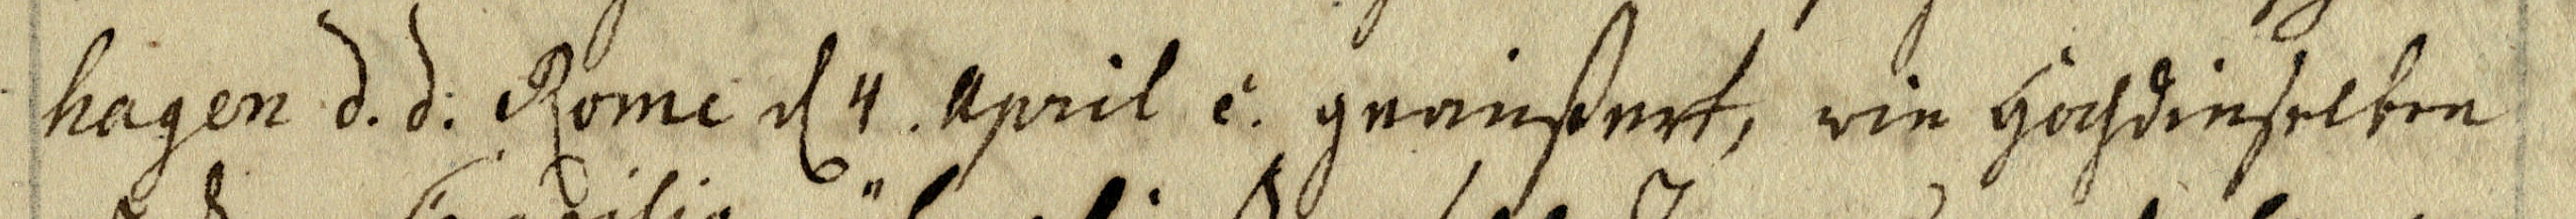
hagen d.d. Rome d 4. April e. geäußert, wie Hochdieselben
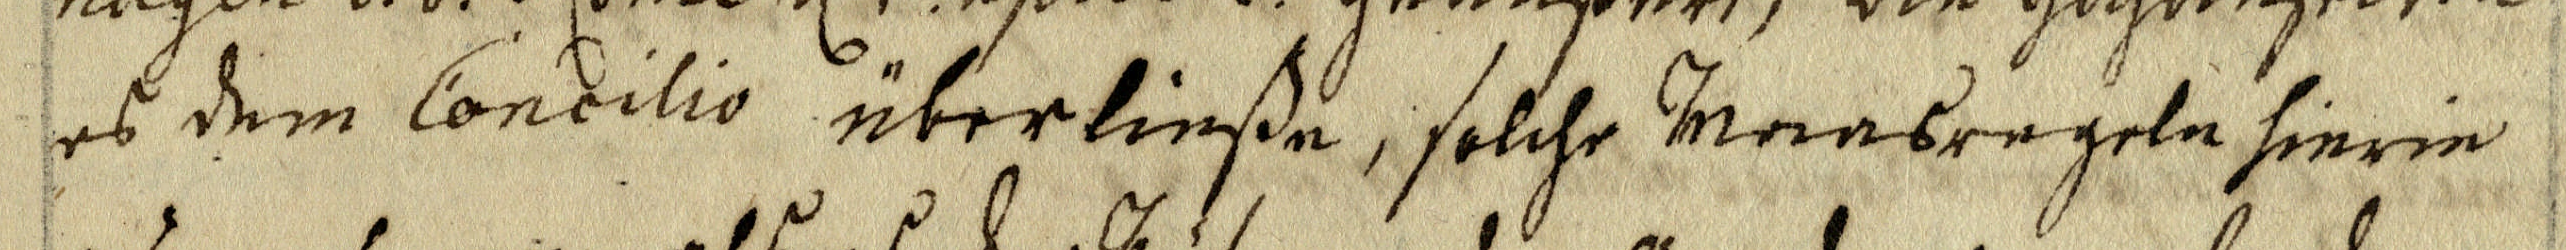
es dem Concilio überließe, solche Maasregeln hierin
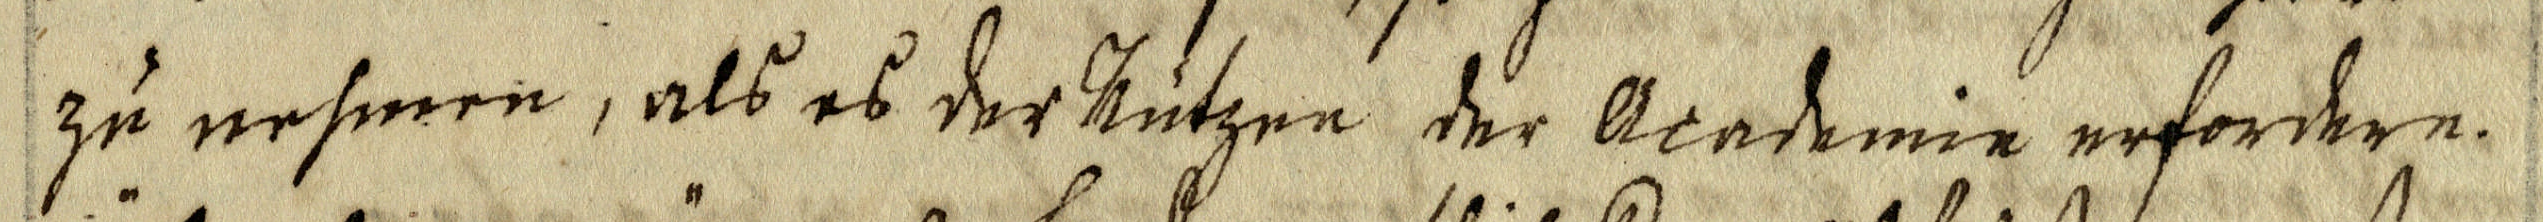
zu nehmen, als es der Nutzen der Academie erfordere.
